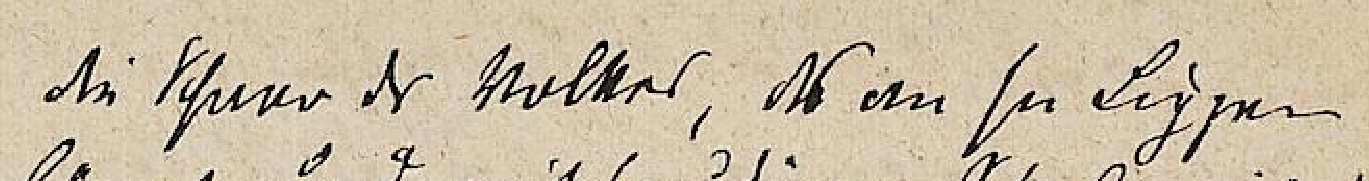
die Schaar ds Volkes, ds an sn Lippen
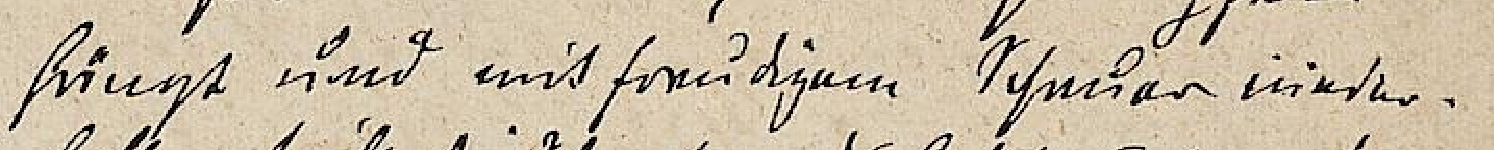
hängt und mit freudiem Schauer nieder¬
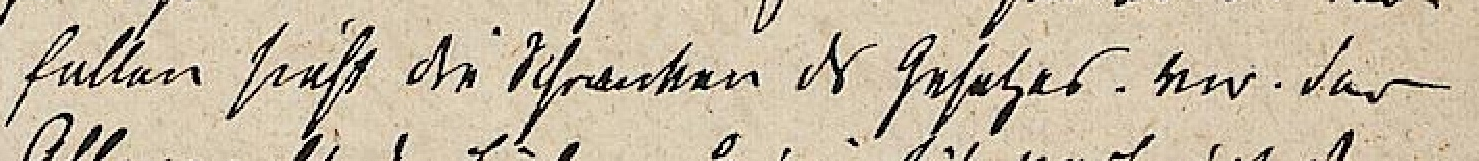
fallen sieht die Schranken ds Gesetzes. vor. der
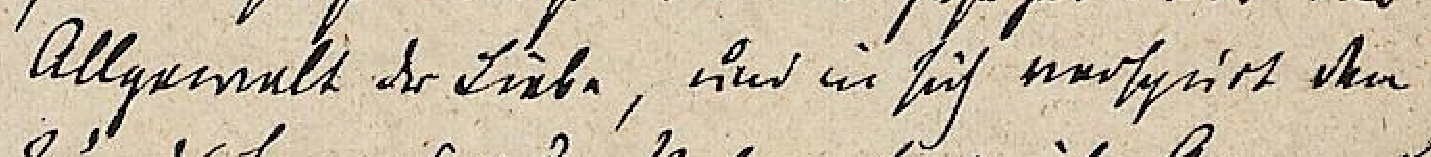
Allgewalt der Liebe, und in sich verspürt den
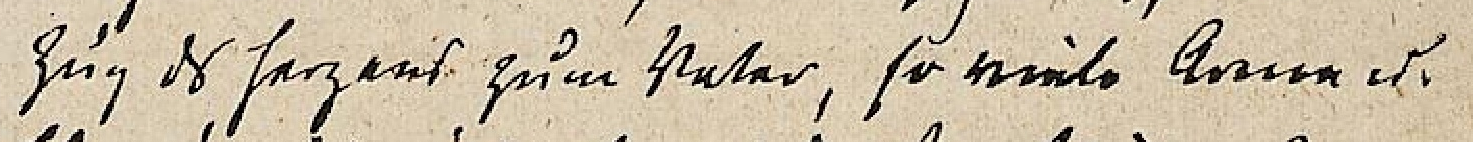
Zug ds Herzens zum Vater, so viele Arme u.
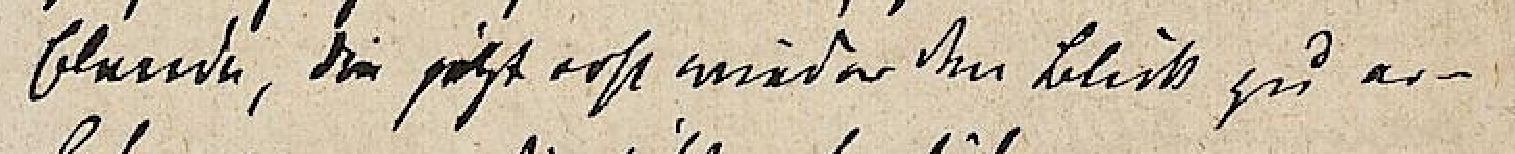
Elende, die jetzt erst wieder den Blick zu er¬
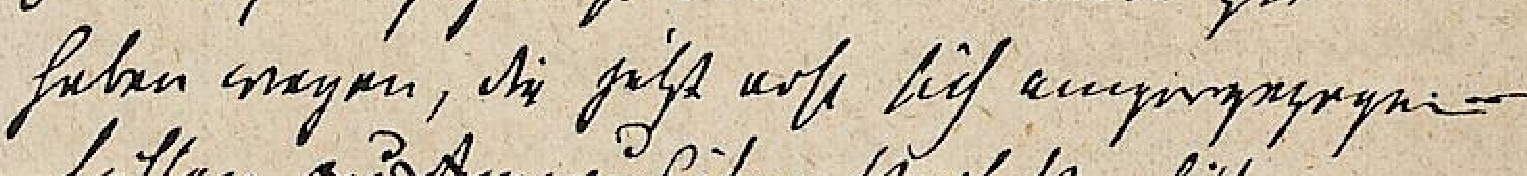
heben wagen, die jetzt erst sich emporgezogen
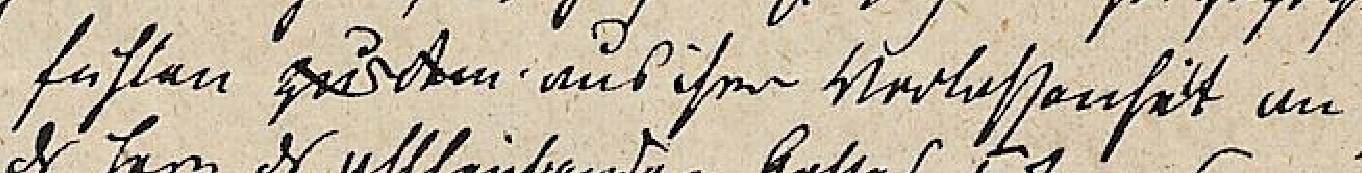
fühlten zu dem aus ihrer Verlassenheit an
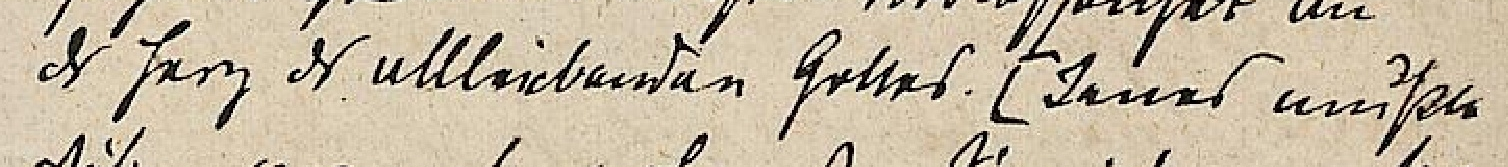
ds Herz ds allliebenden Gottes. [Jenes mußte
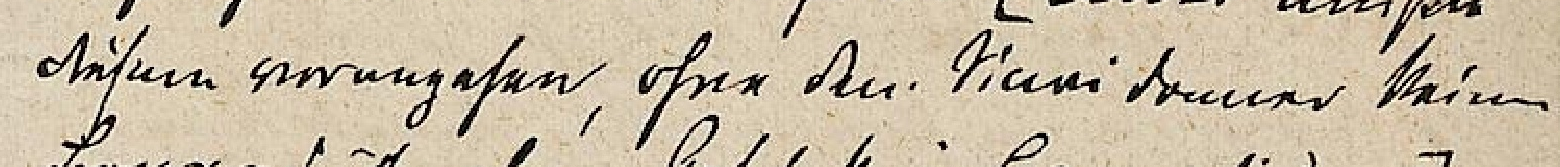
diesem vorangehen, ohne den Sinaidonner keine
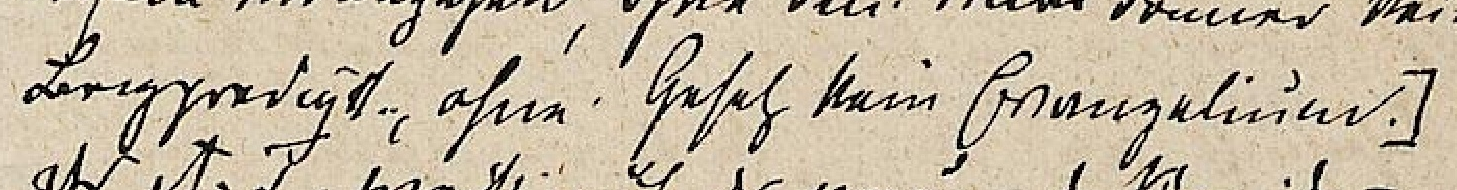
Bergpredigt, ohne Gesetz kein Evangelium.]
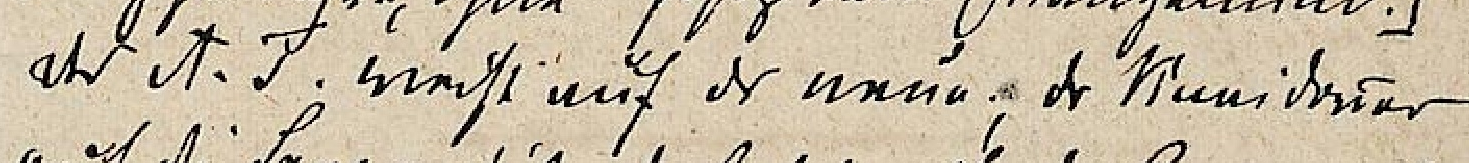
Das A.T. weist auf dr neue; dr Sinaidoner
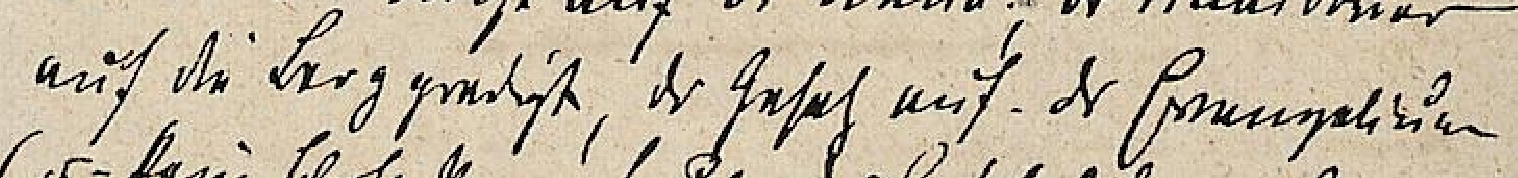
auf die Bergpredigt, ds Gesetzt auf. ds Evangelium
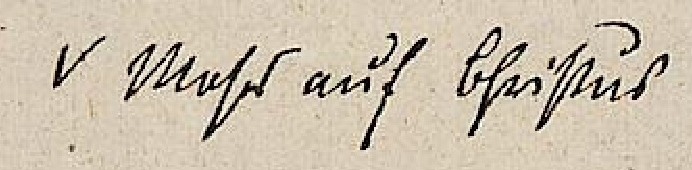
V Mnss auf Christus
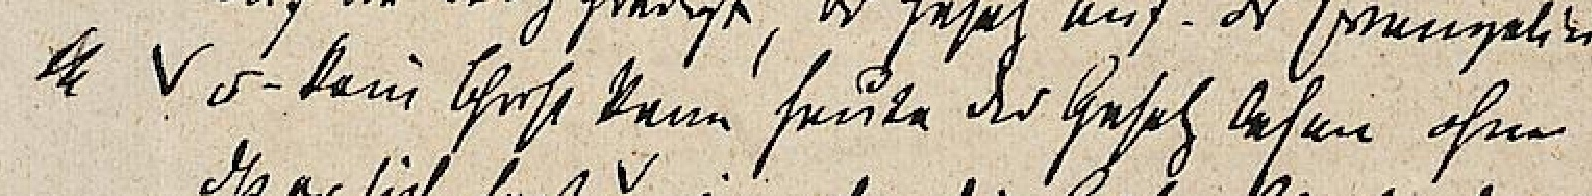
1 V u. kein Christ kann heute ds Gesetz lesen ohne
